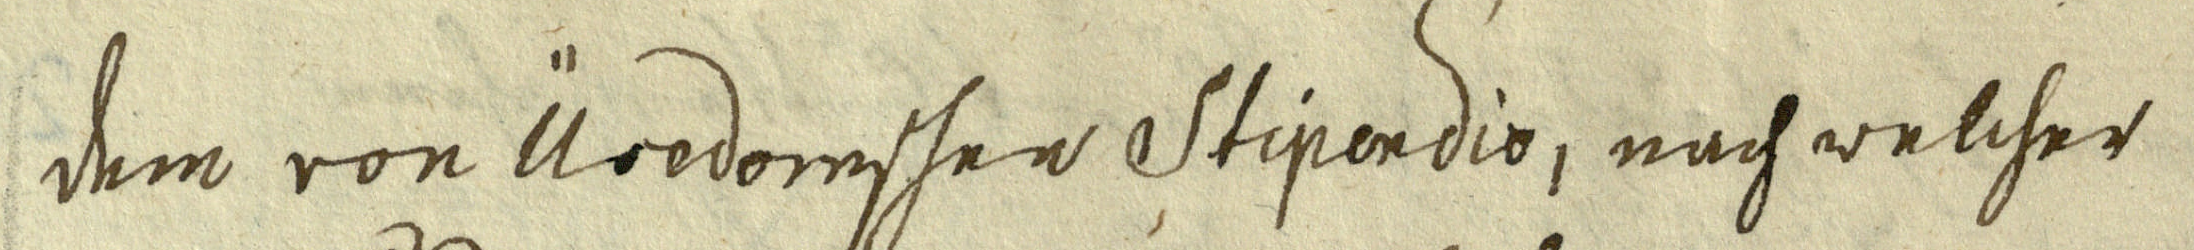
dem von Üsedomschen Stipendio, nach welcher
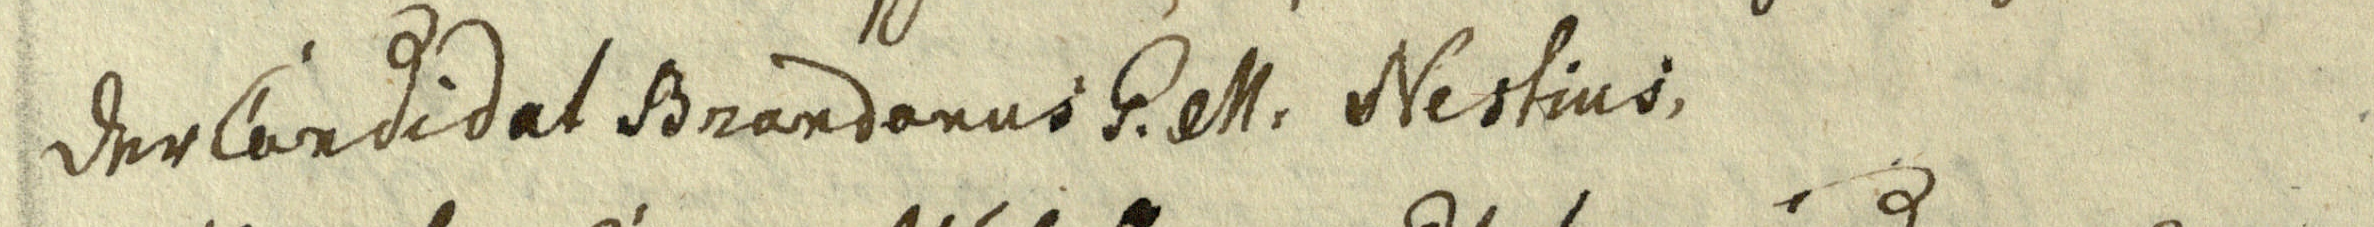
der Candidat Brandanus G. M. Nestius,
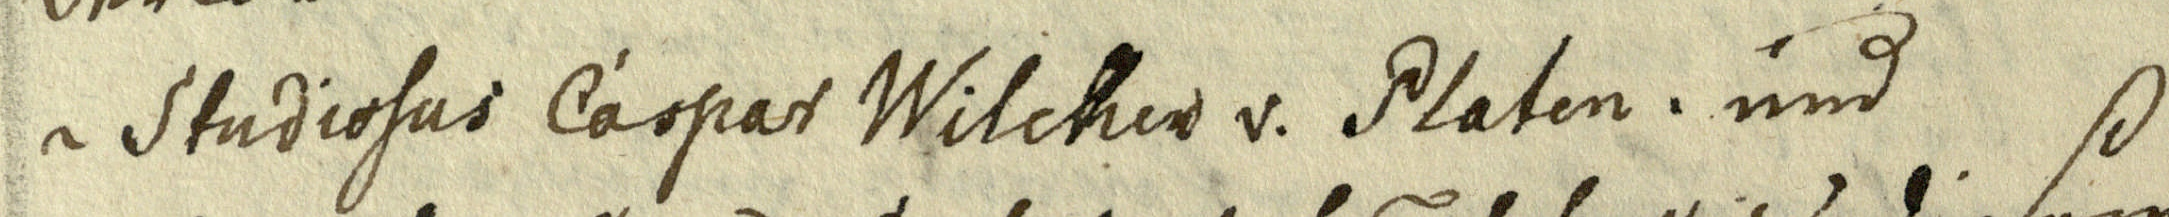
Studiosus Caspar Wilcken v. Platen und
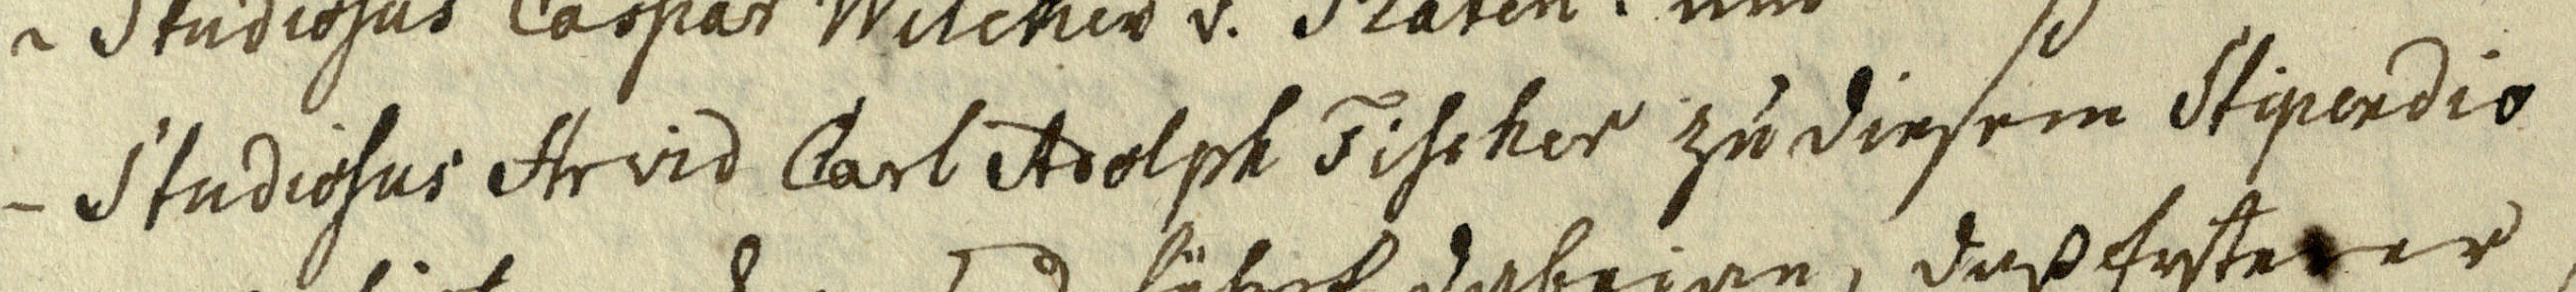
Studiosus Arvid Carl Adolph Fischer zu diesem Stipendio
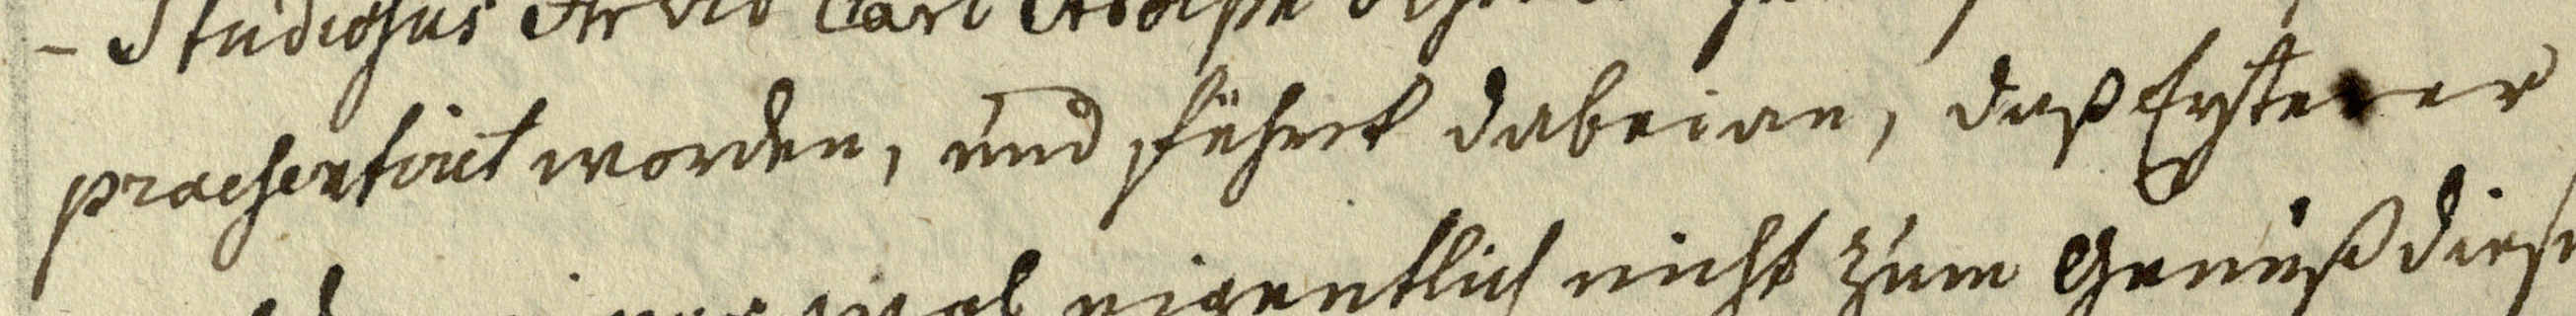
praesentiret worden, und führet dabei an, daß Ersterer
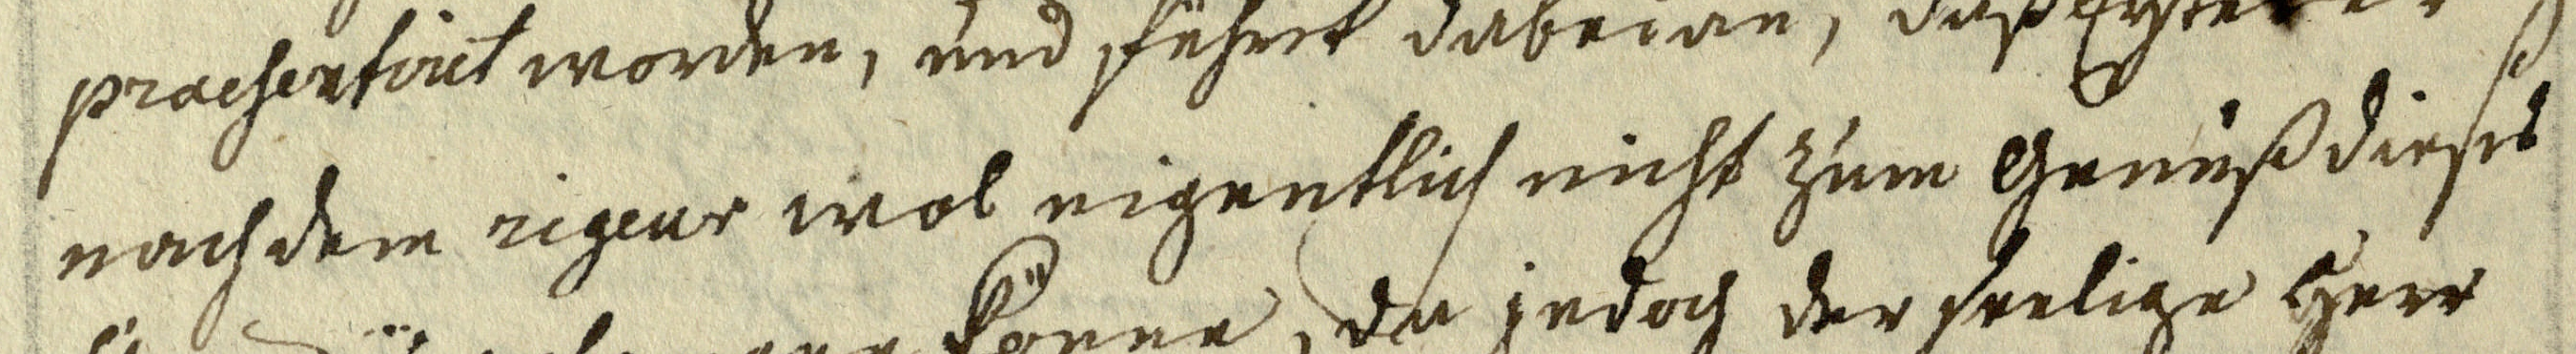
nach dem rigeur wol eigentlich nicht zum Genuß dieses
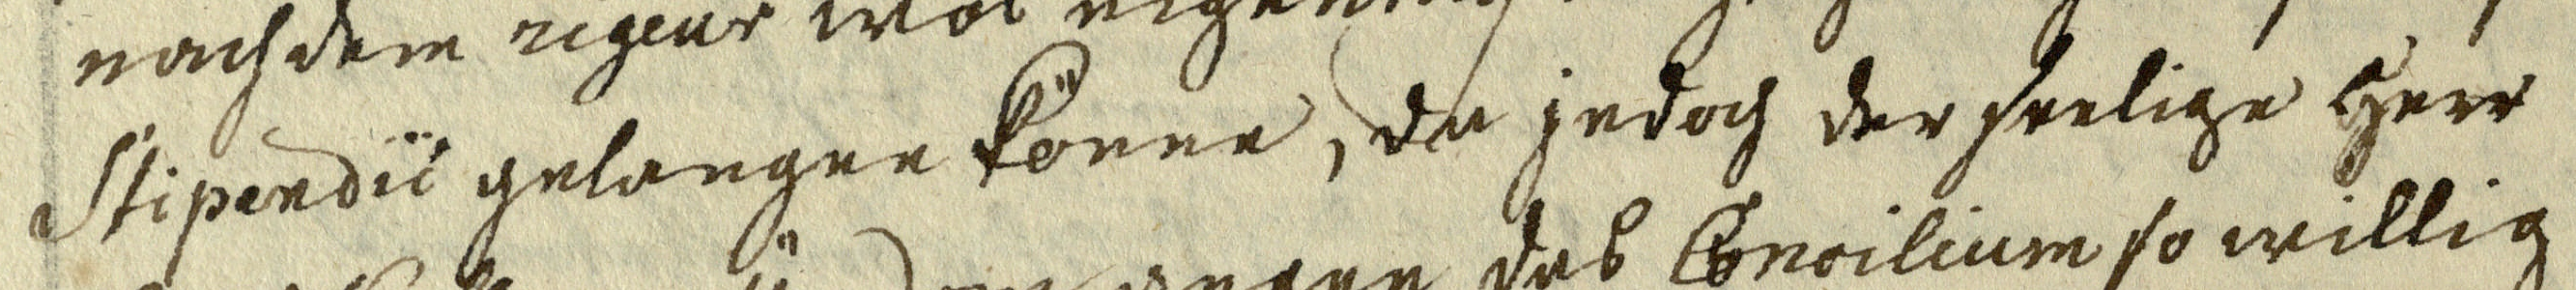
Stipendii gelangen könne, da jedoch der seelige Herr
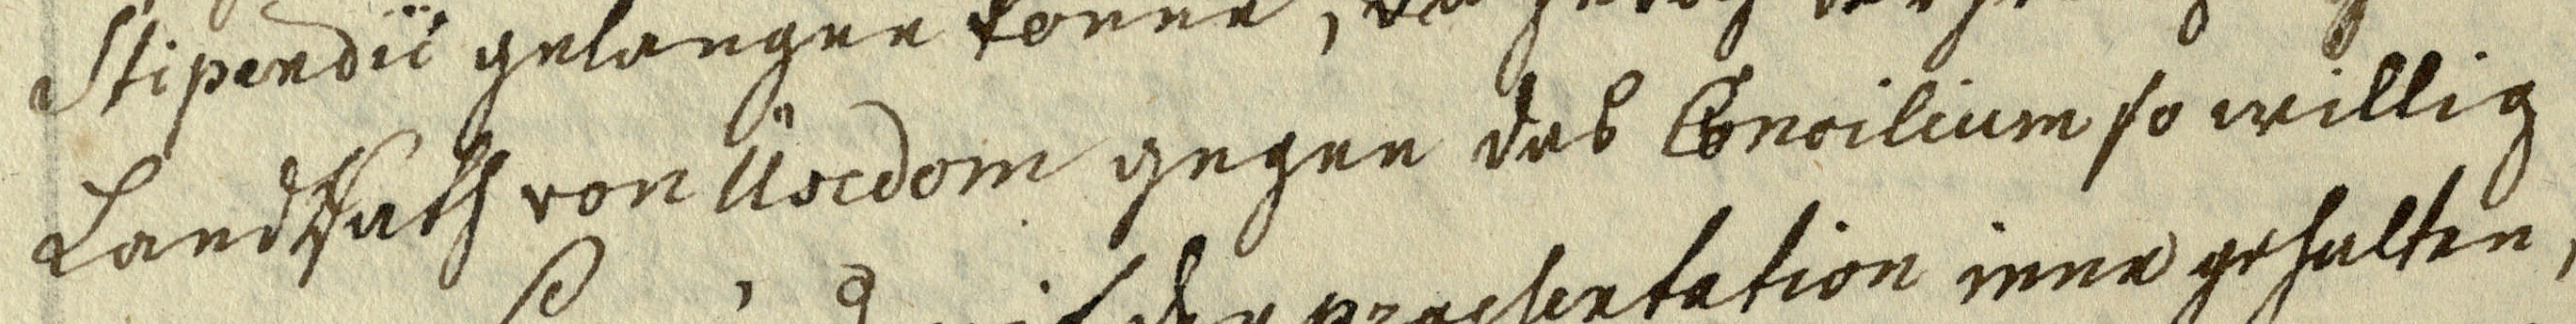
LandRath von Üsedom gegen das Concilium so willig
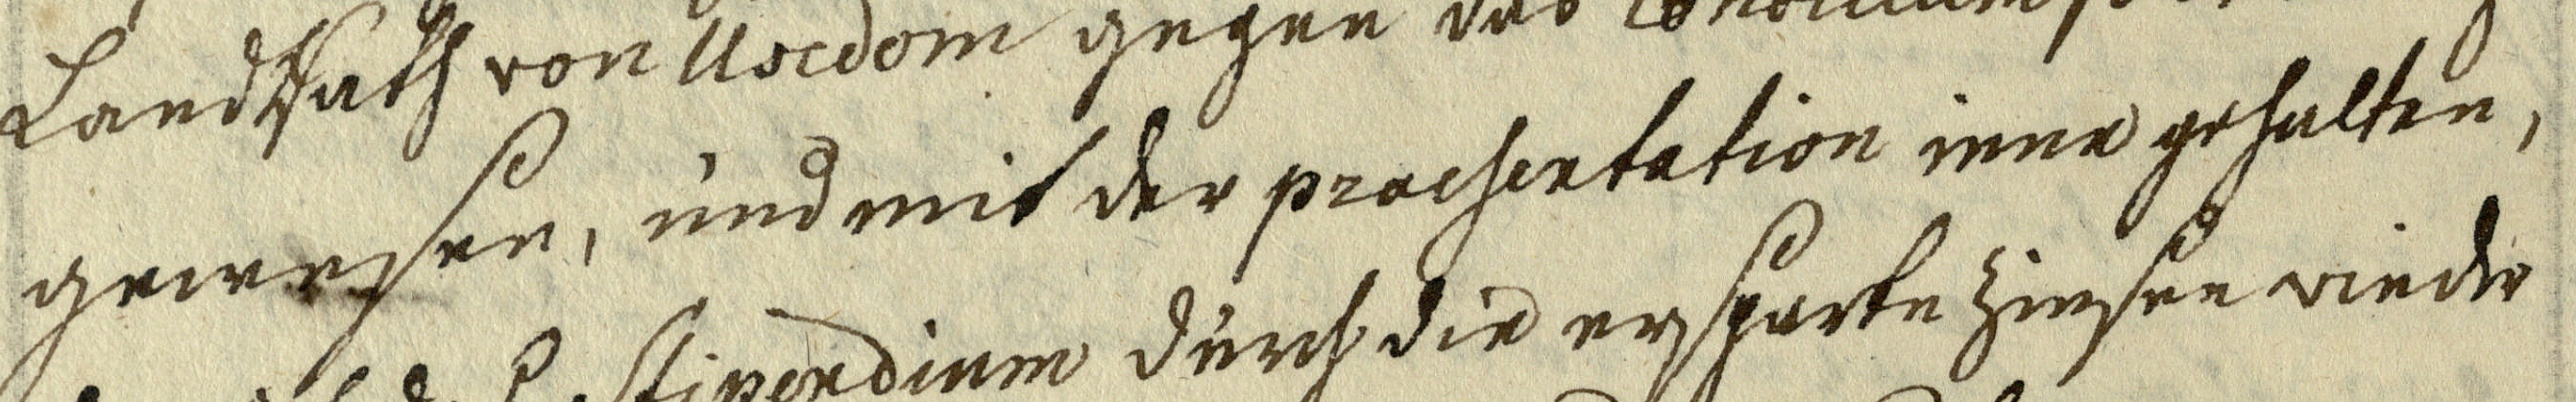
gewesen, und mit der praesentation inne gehalten,
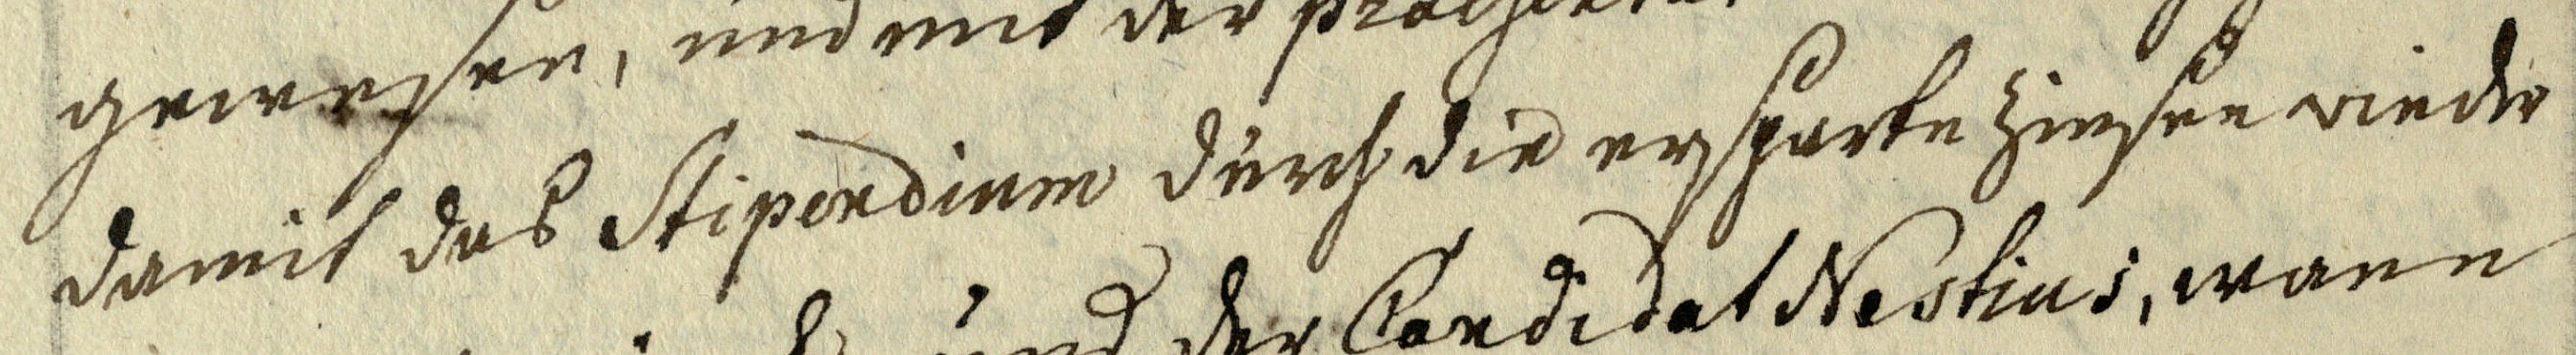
damit das Stipendium durch die ersparte Zinsen wieder
